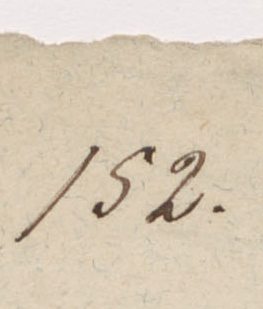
152.
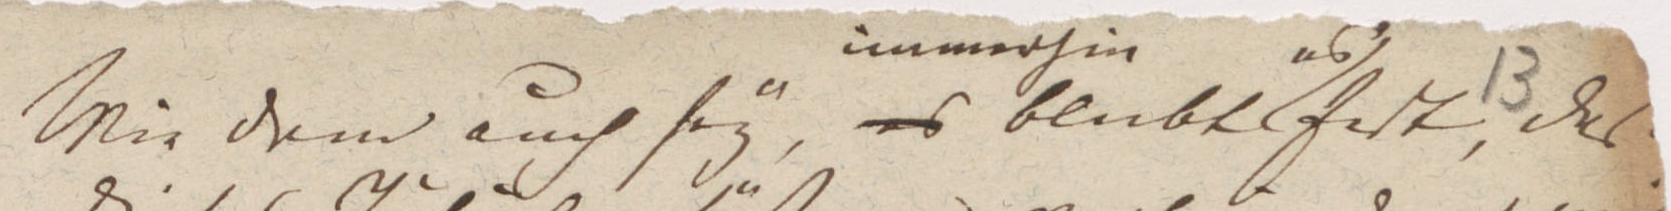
Wie dem auch sey, es immerhin bleibt es fest, das
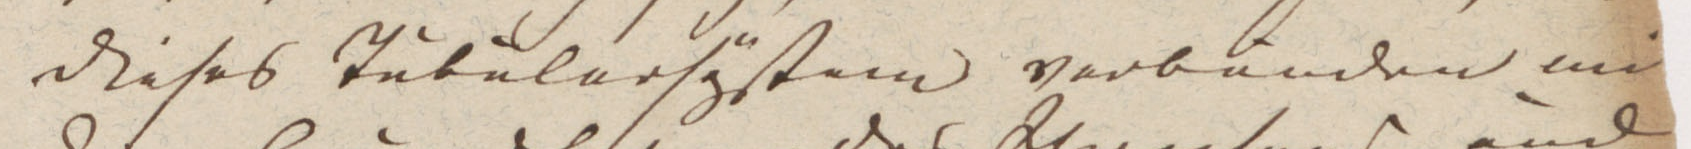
dieses Tubularsystem verbunden mi
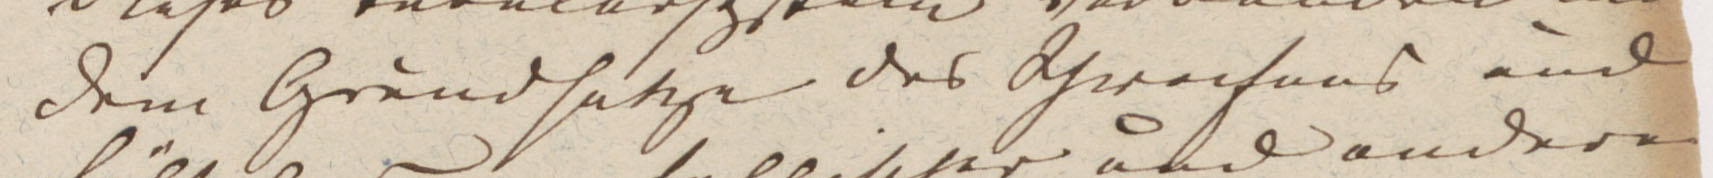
dem Grundsatze des Schweifens und
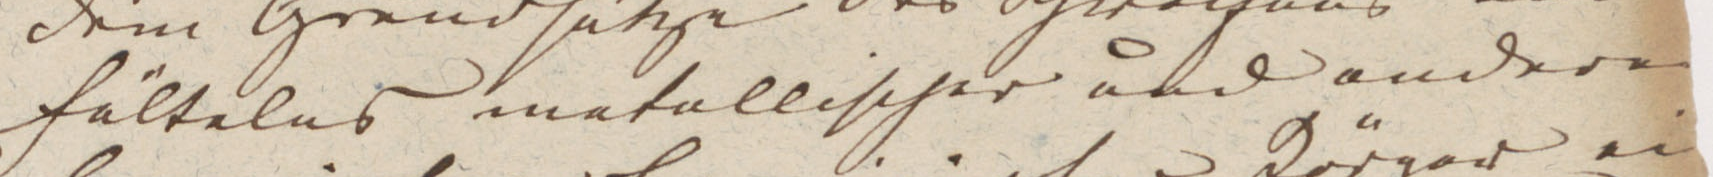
Fältelns metallischer und anderer
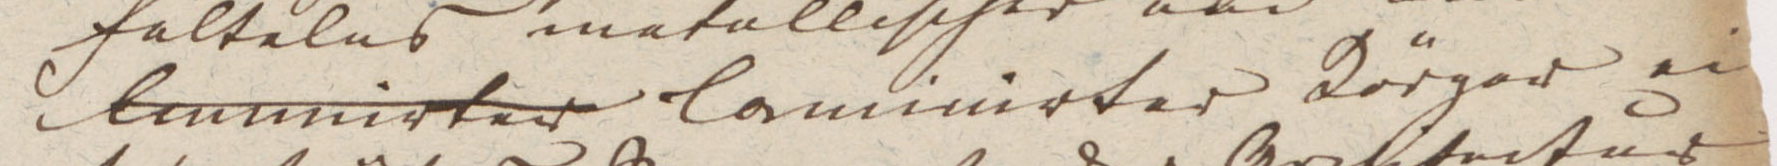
lamnirter laminirter Körper ein
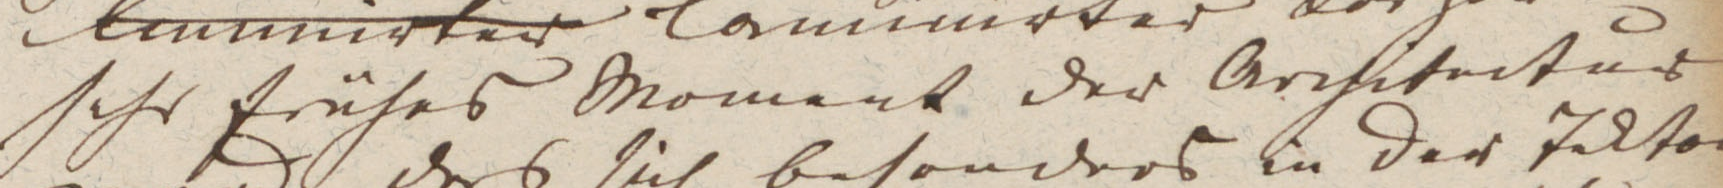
sehr frühes Moment der Architectur
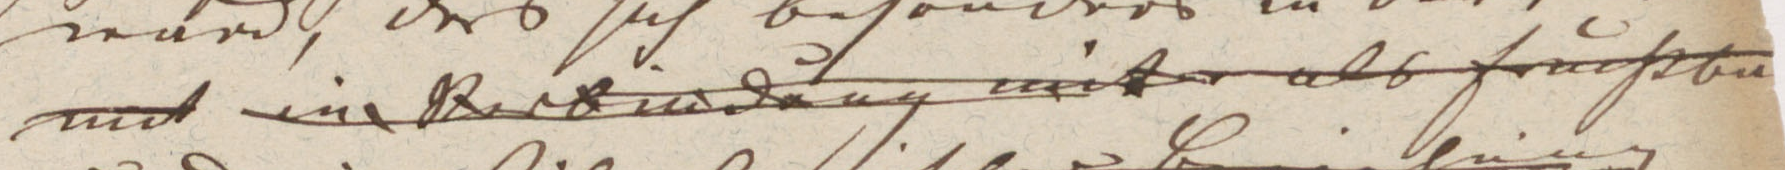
mit in Verbindung mit als fruchtbar
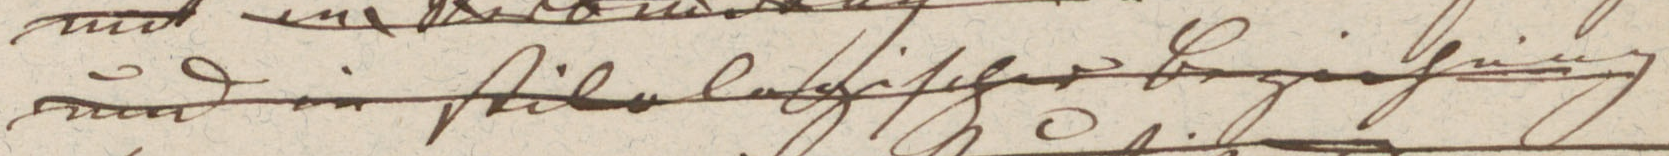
und in stilologischer Beziehung
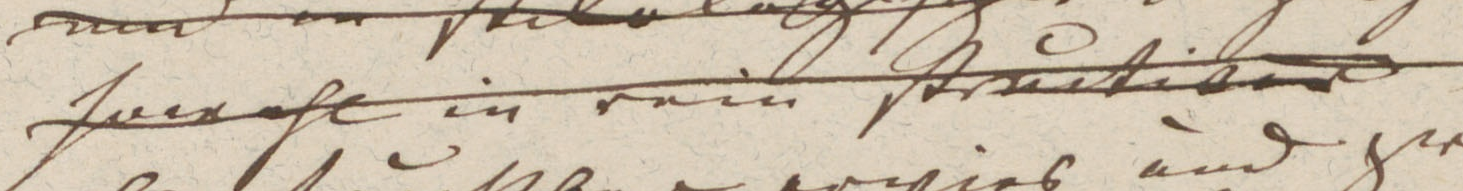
sowohl in rein structiver
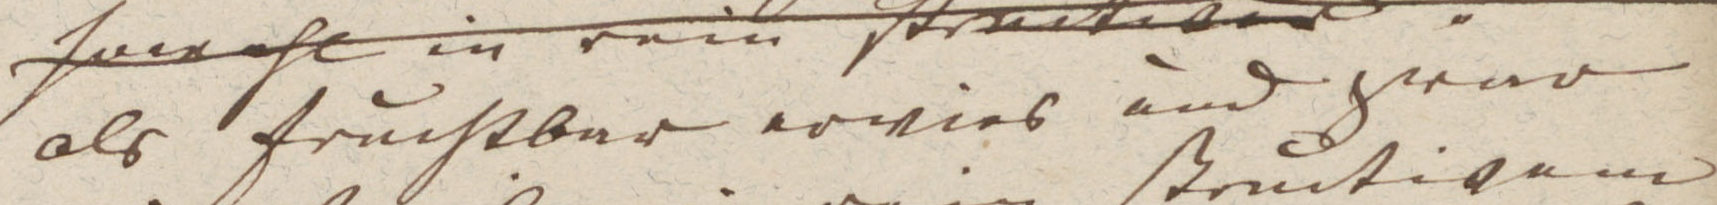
als fruchtbar erwies und zwar
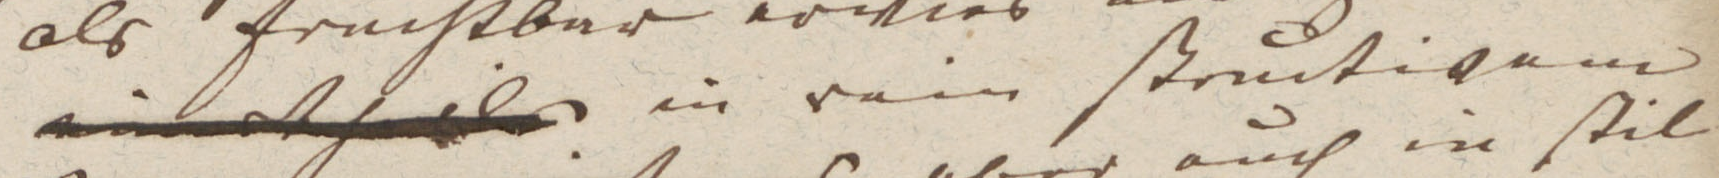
einestheils in rein structivem
